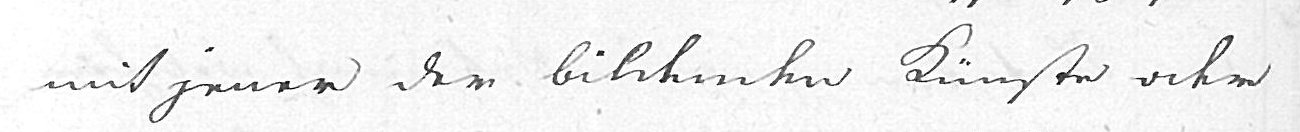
mit jener der bildenden Künste oder
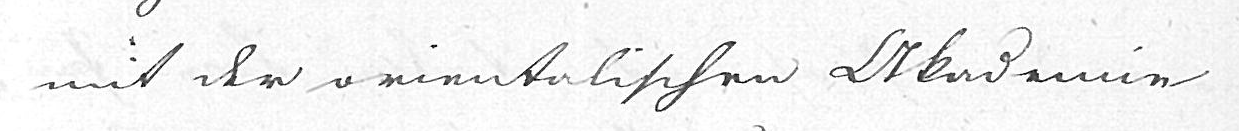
mit der orientalischen Akademie
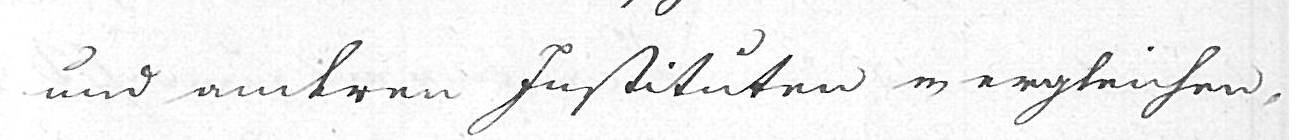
und anderen Instituten vergleichen,
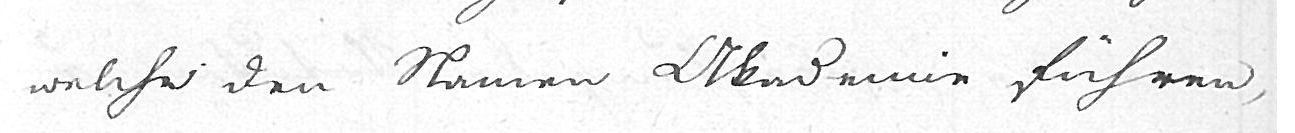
welche den Namen Akademie führen,
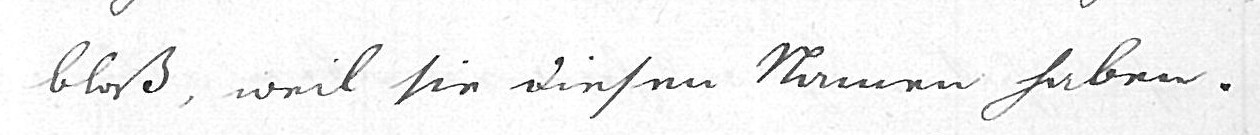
bloß, weil sie diesen Namen haben.
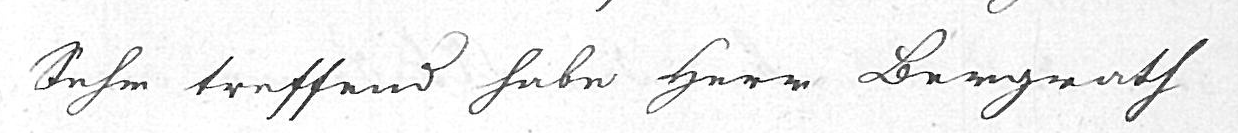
Sehr treffend habe Herr Bergrath
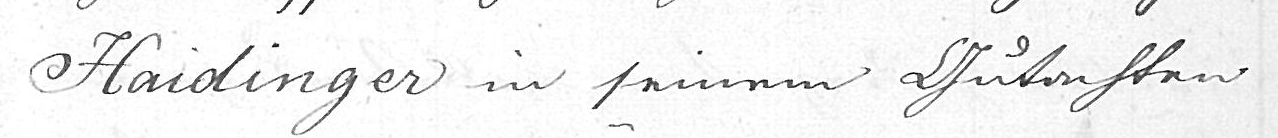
Haiding in seinem Gutachten
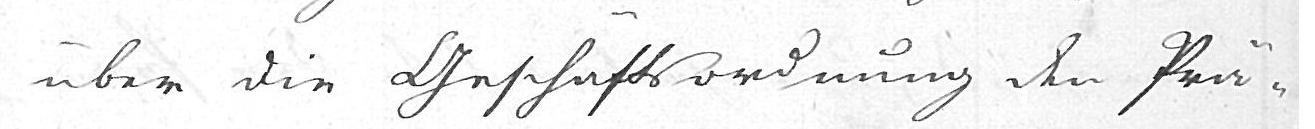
über die Geschäftsordnung den Prä-
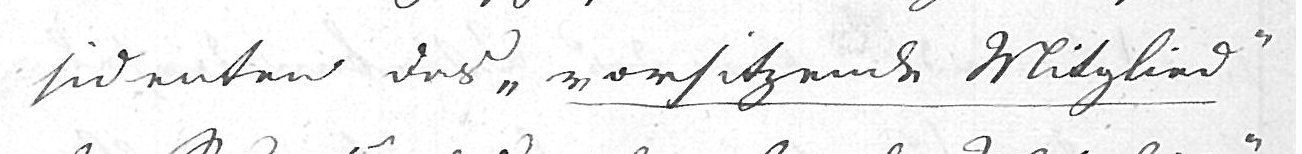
sidenten das "vorsitzende Mitglied"
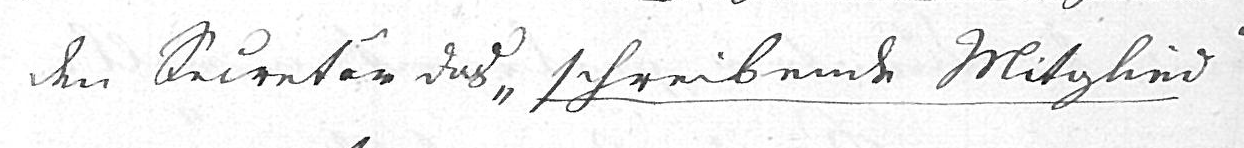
den Secretär das "schreibende Mitglied"
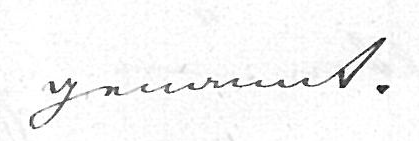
genannt.
